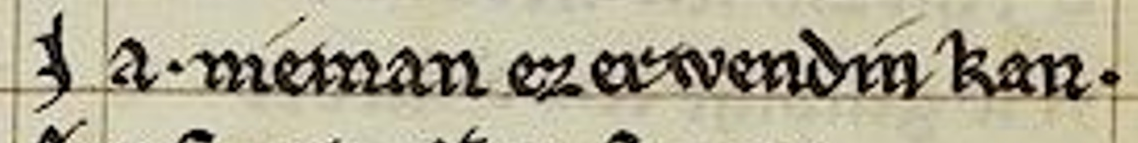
Ja. nieman ez erwendin kan.
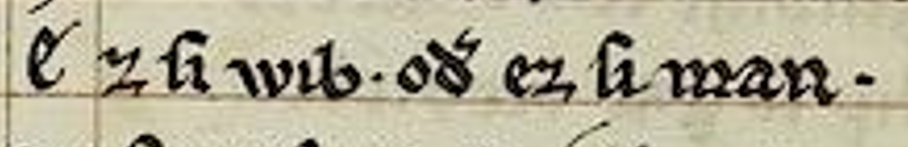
Ez ſi wib. od(er) ez ſi man.
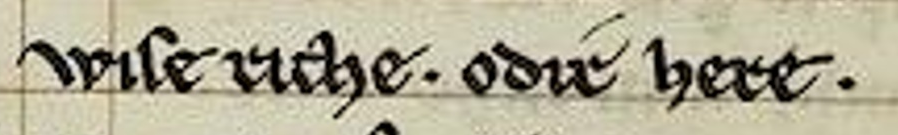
Wiſe riche. odir here.
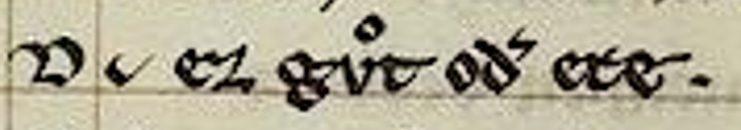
D(az) ez gv°ot od(er) ere.
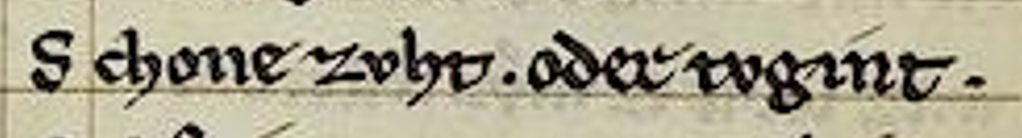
Schone zvht. oder tvgint.
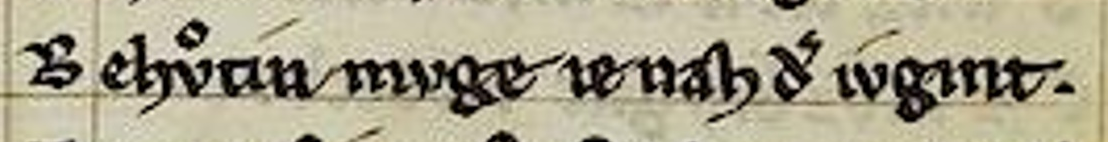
Behv°otin mvge ie nah d(er) ivgint.
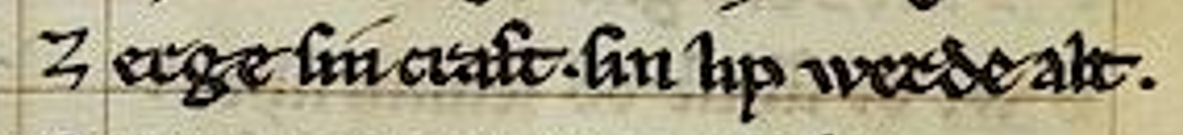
Zerge ſin craft. Sin lip werde alt.
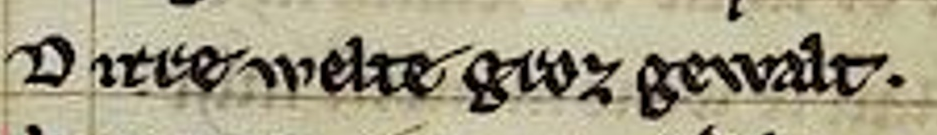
Dirre welte groz gewalt.
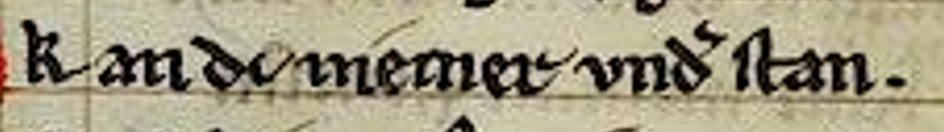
Kan d(az) niemer vnd(er) ſtan.
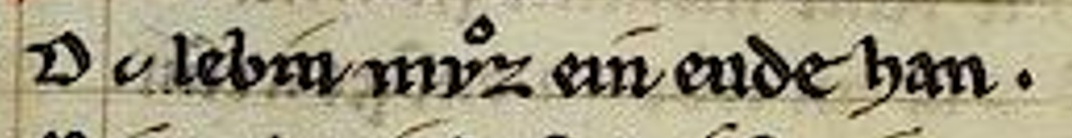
D(az) lebin mv°oz ein ende han.
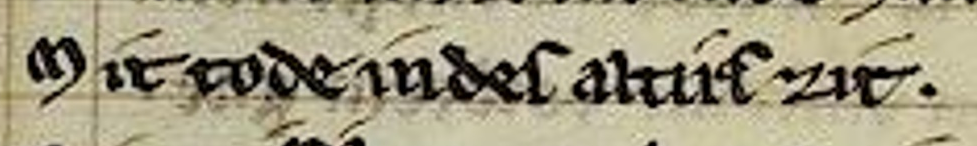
Mit tode in deſ altirſ zit.
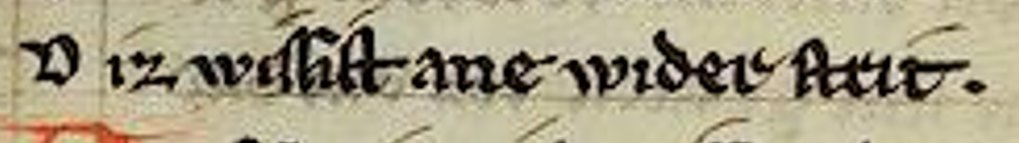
Diz wiſſiſt ane wider ſtrit.
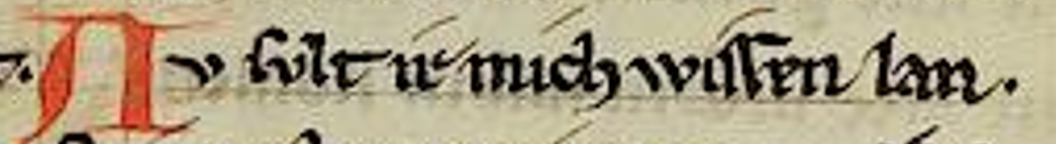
*Nv ſvlt ir mich wiſſen lan.
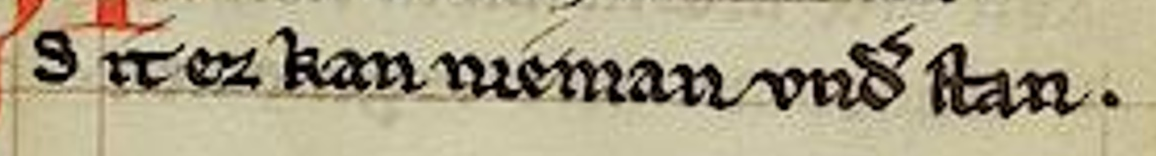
Sit ez kan nieman vnd(er) ſtan.
